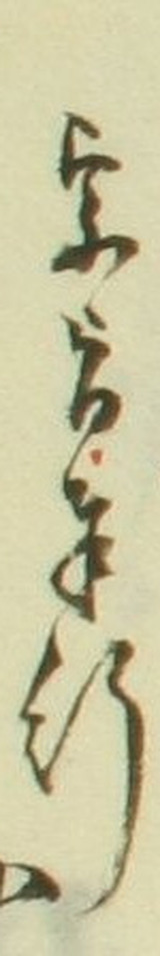宗旨奉行
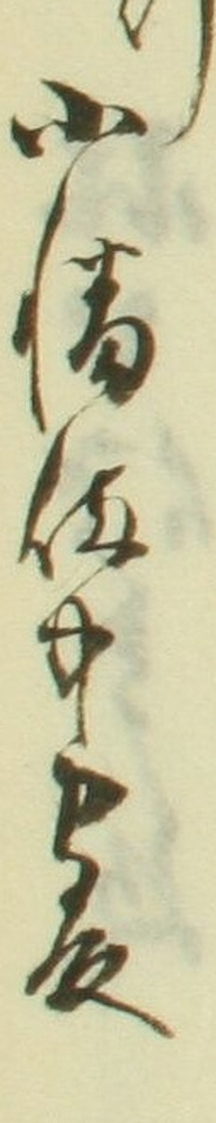小幡備中守殿

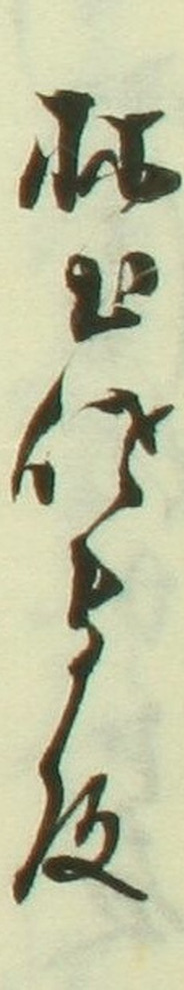林土佐守殿
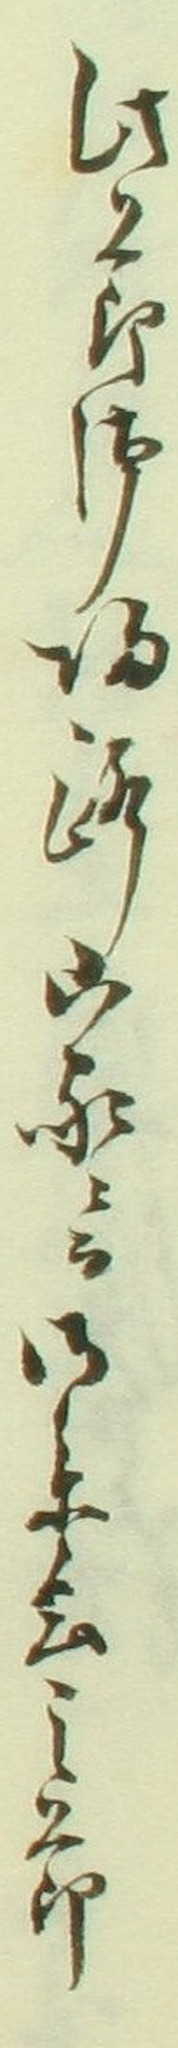此節御帰路山家ニ而御参会之節
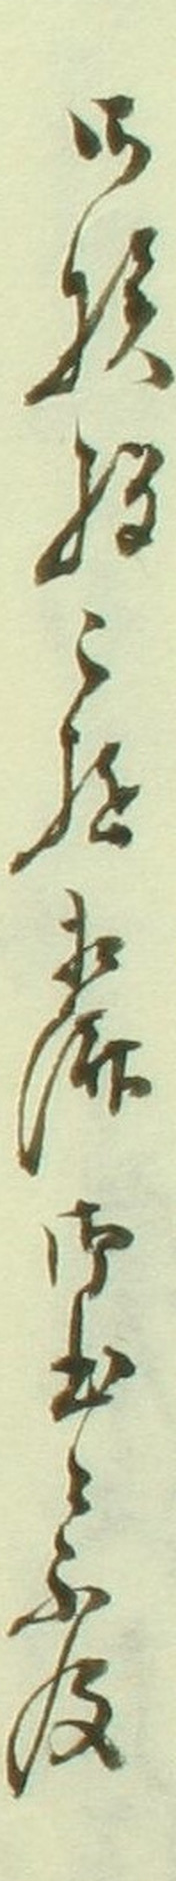御挨拶被遊相済御書ニ不及
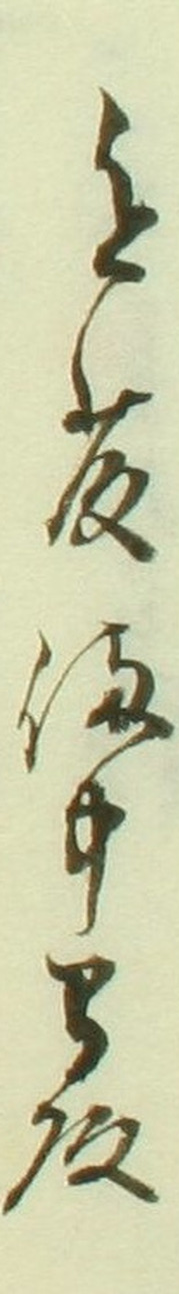近藤備中守殿
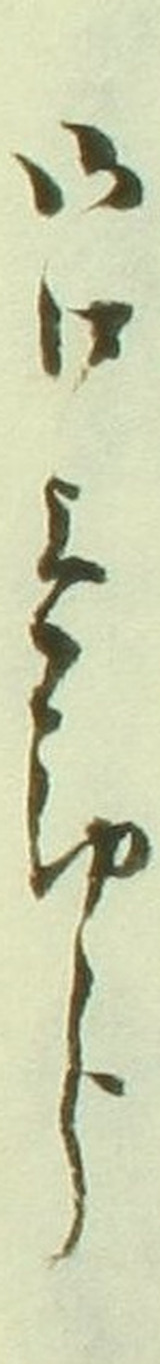御口上勤分
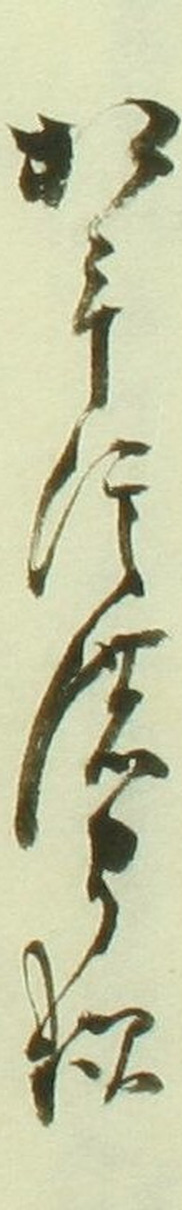松平信濃守様
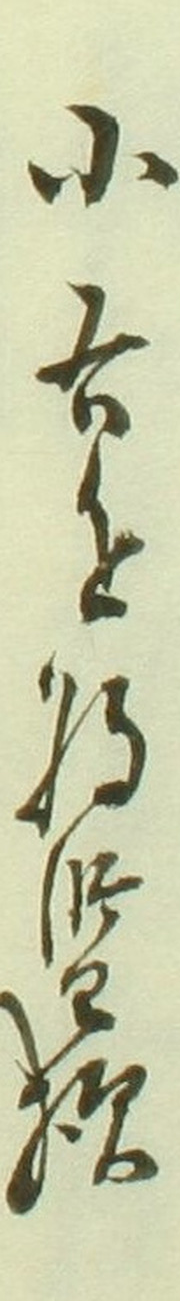小右近将監様
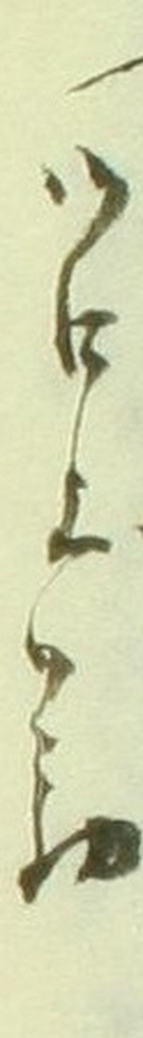御口上勤分
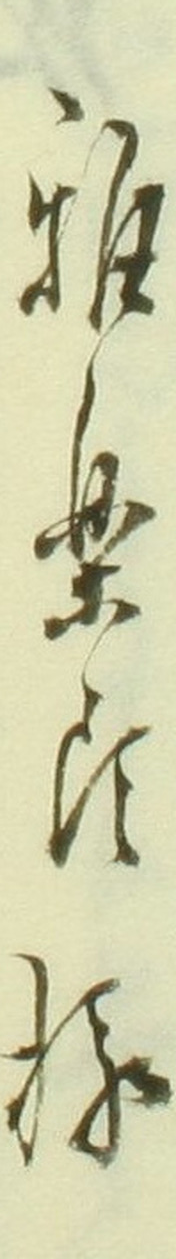雅楽頭様
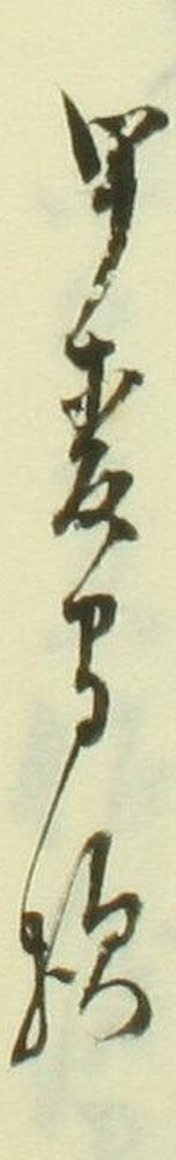甲斐守様
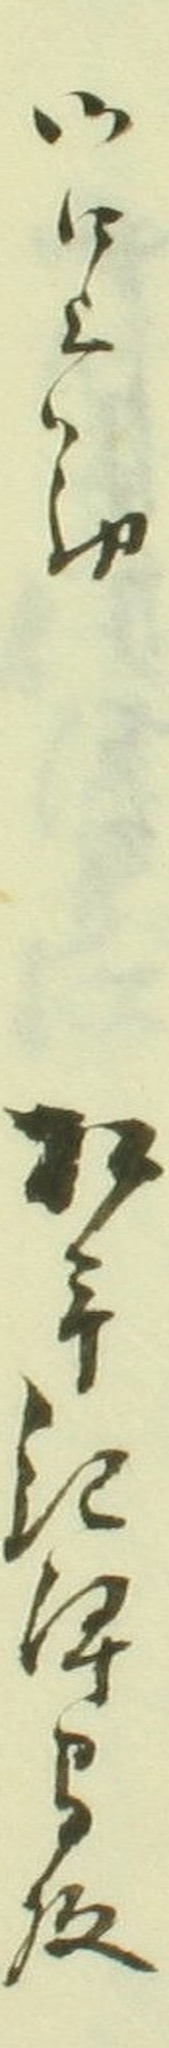御口上勤松平紀伊守殿
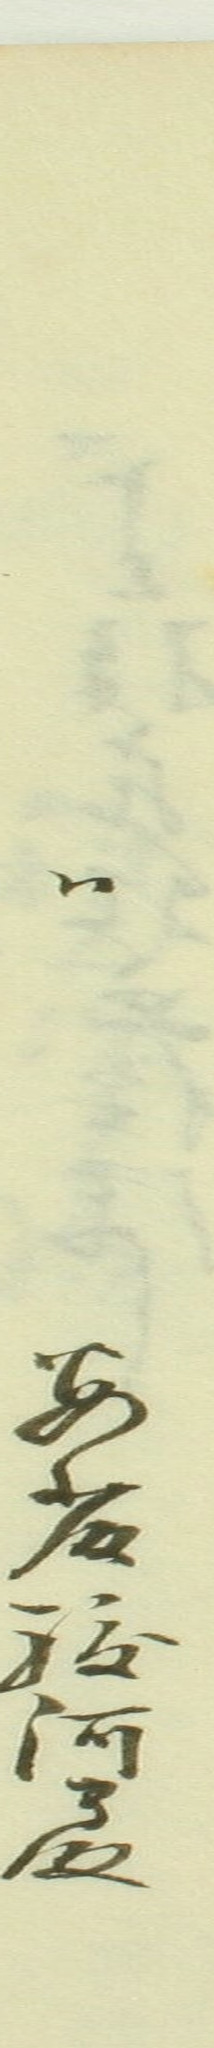同安藤駿河守殿
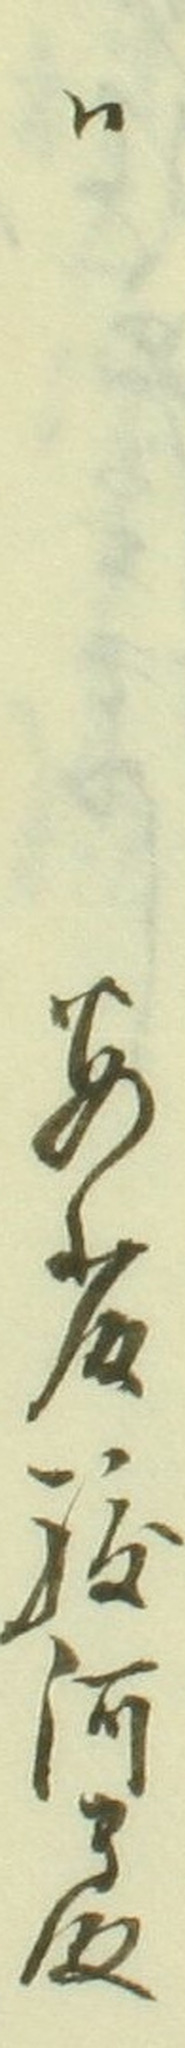同安藤駿河守殿
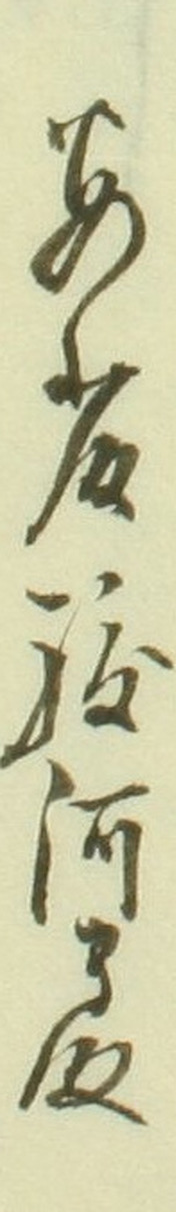同安藤駿河守殿
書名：異国船漂着記
